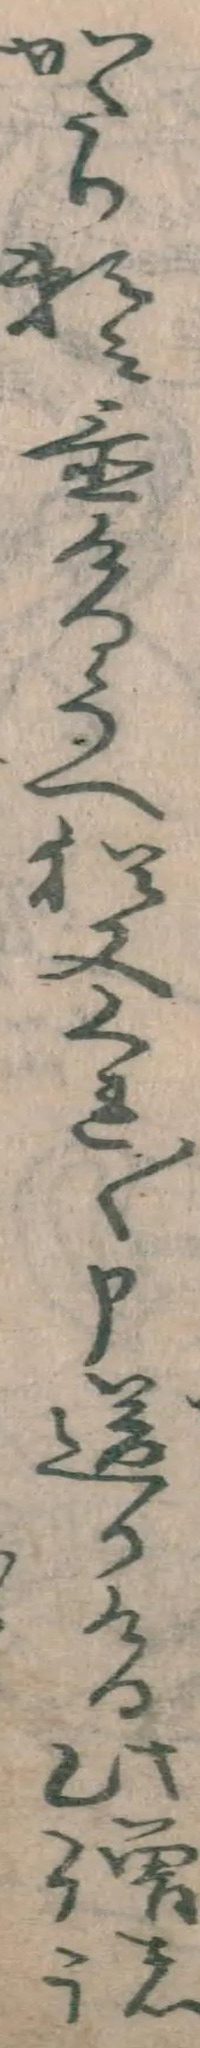かたり頼み置けるうへ猶又くれ〳〵申送りける此僧諸
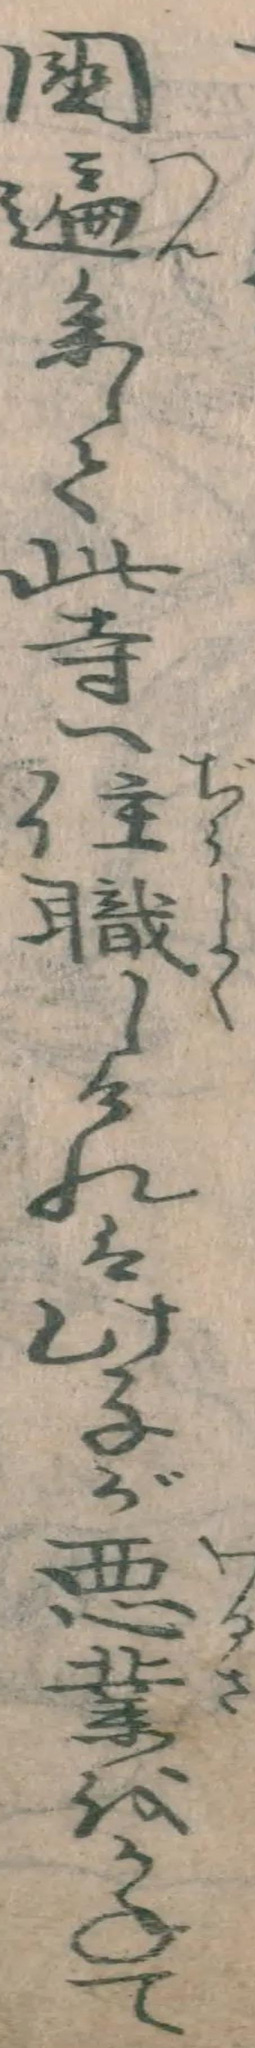国遍参して此寺へ住職しけれは此子が悪業をかねて
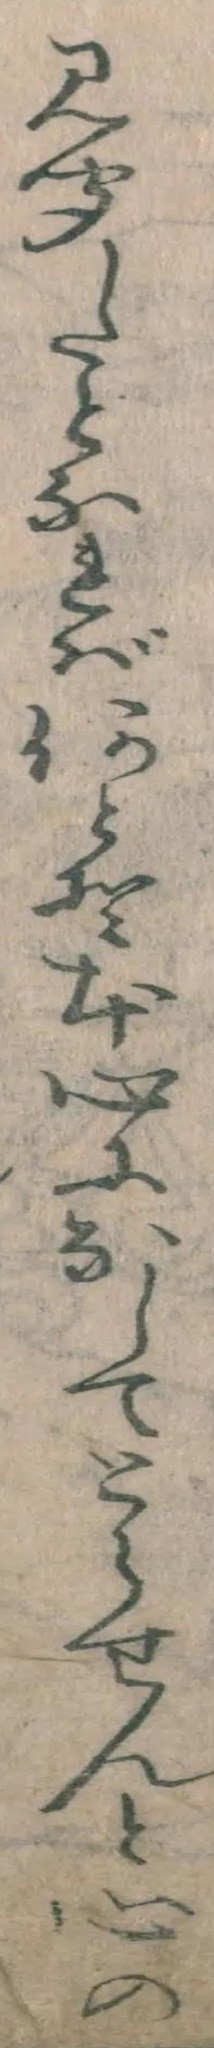見聞したとなれば何とその本心になしてとらせんと心の
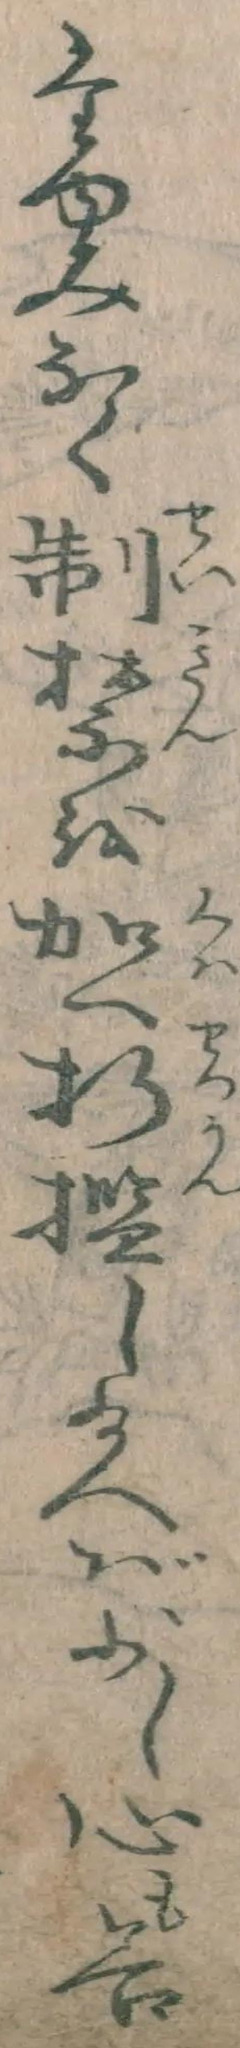たゆみなく制禁を加へ折檻し給へば少し心も善
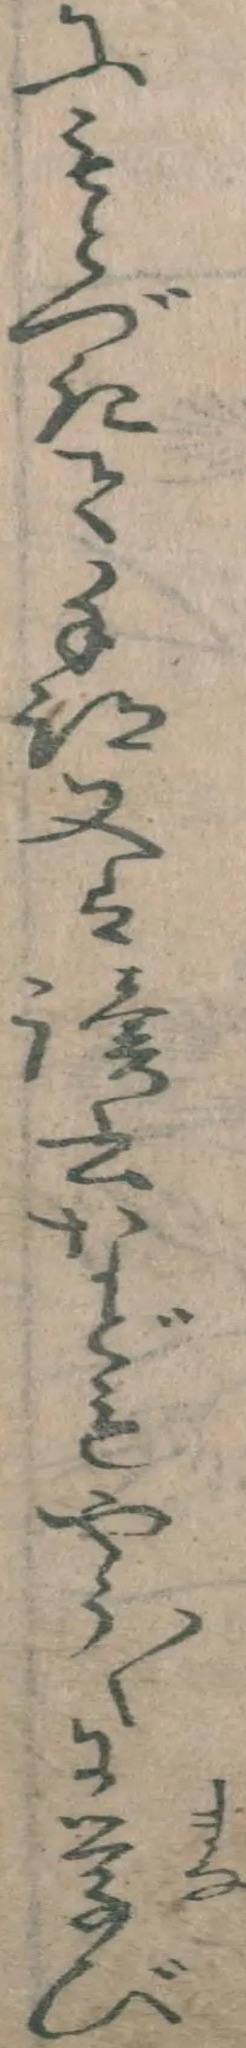にもとづきて手跡又は読書などもやう〳〵に学び

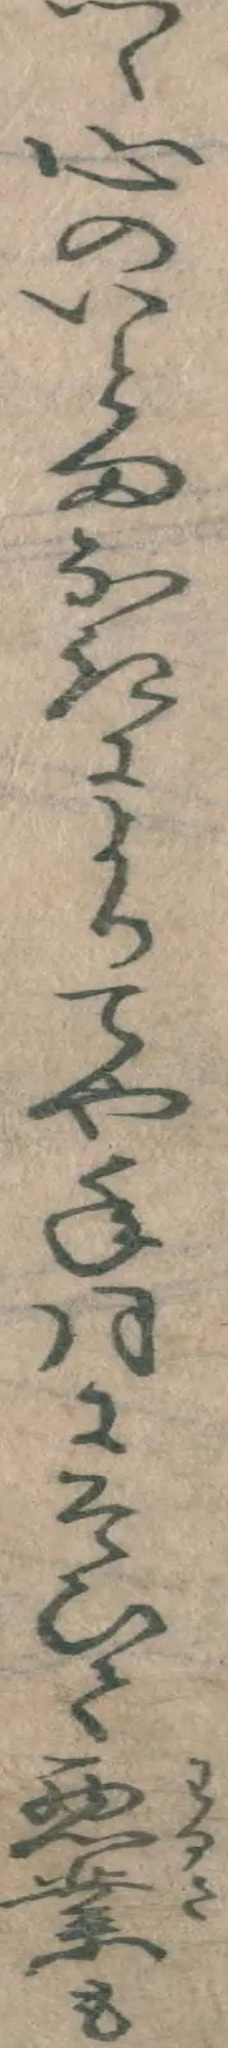つゝ心のいとまなきによりてや年月にそひて悪業も
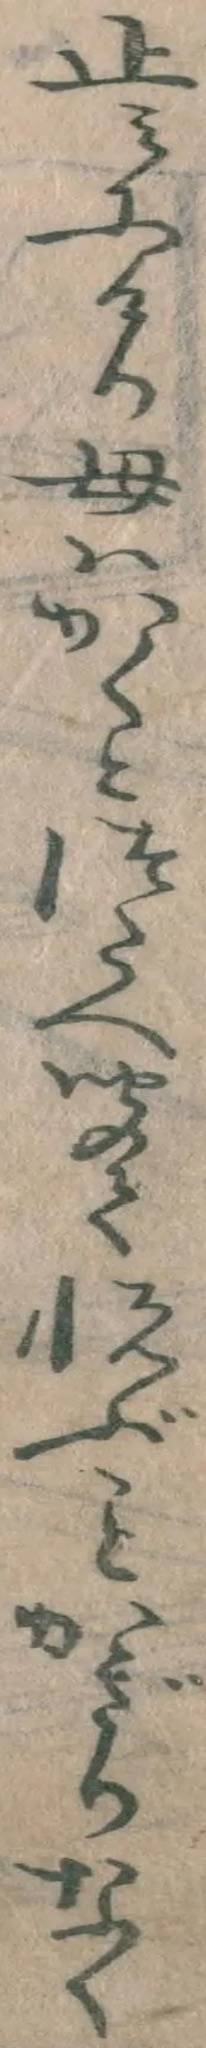止みにけり母はかくとつたへ聞て悦ぶことかぎりなく
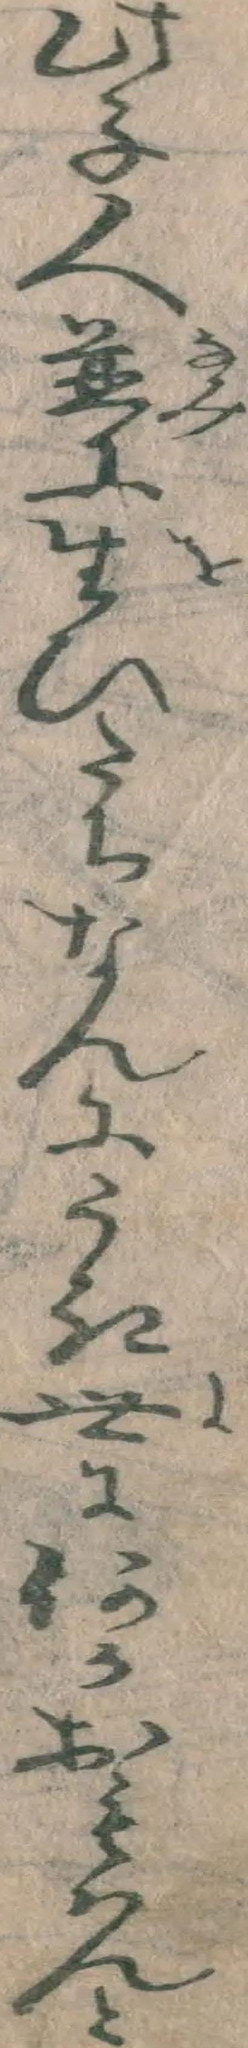此子人並に生ひたちなんにうき世に何かおもはんと
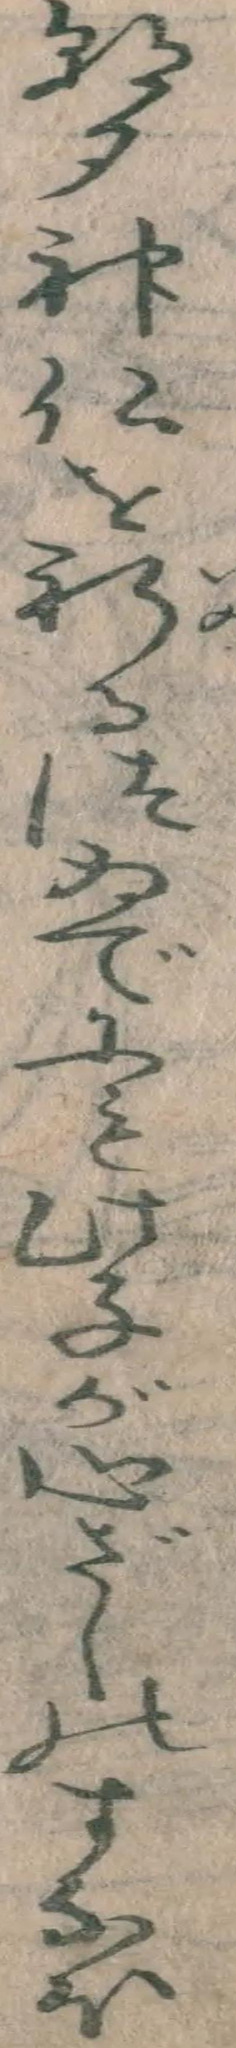朝夕神仏を祈るついでにも此子が心ざしのすなほ
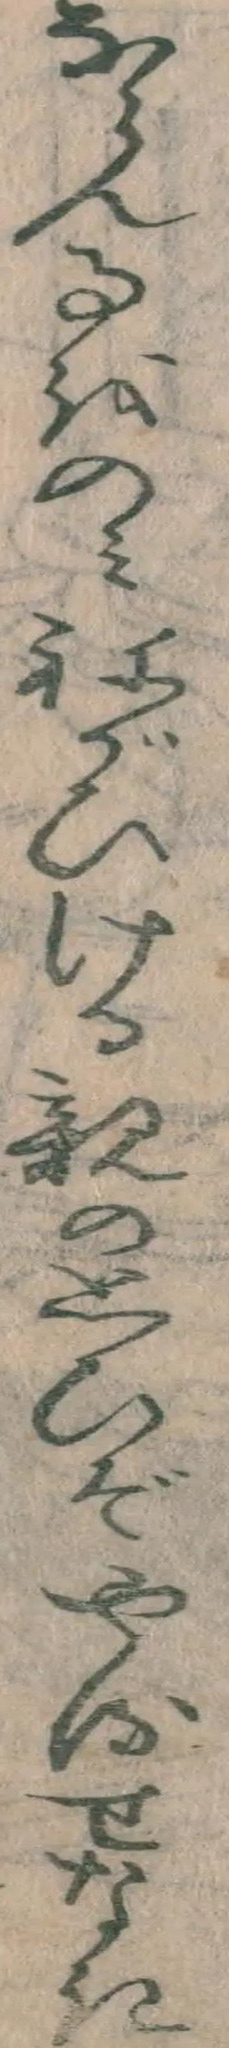ならん事をのみねがひける親の思ひぞやるせなき
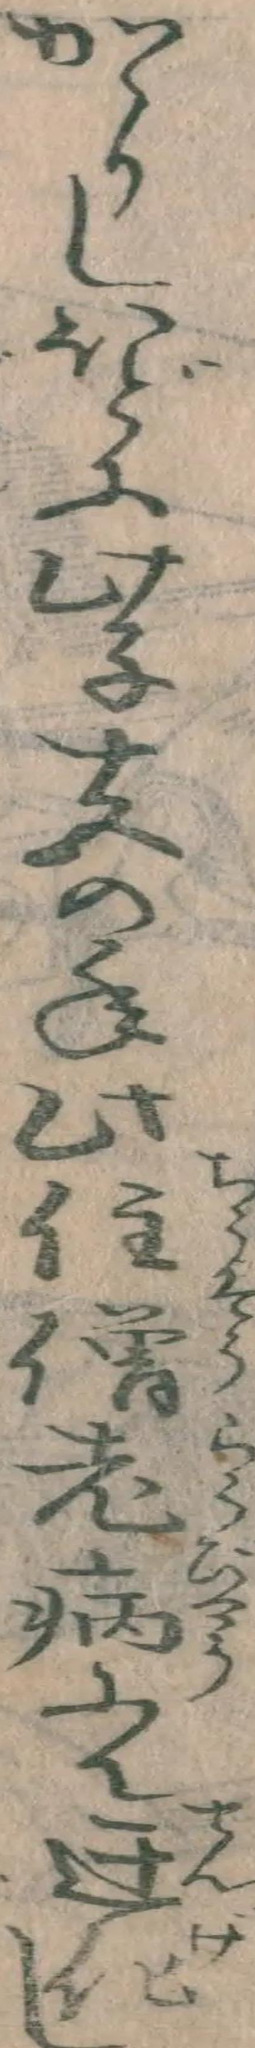かゝりしほどに此子十五の年此住僧老病にて遷化し
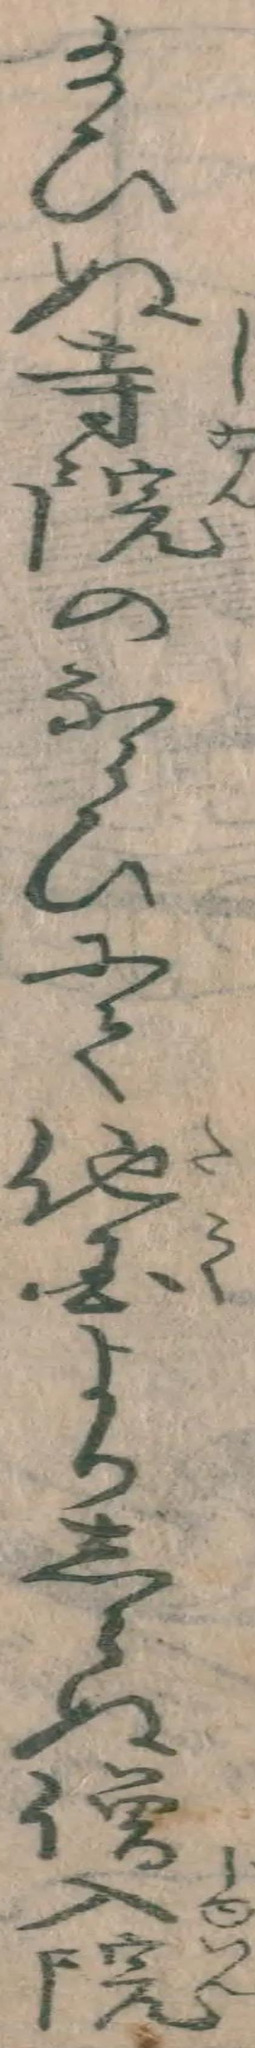給ひぬ寺院のならひにて他国よりしらぬ僧入院
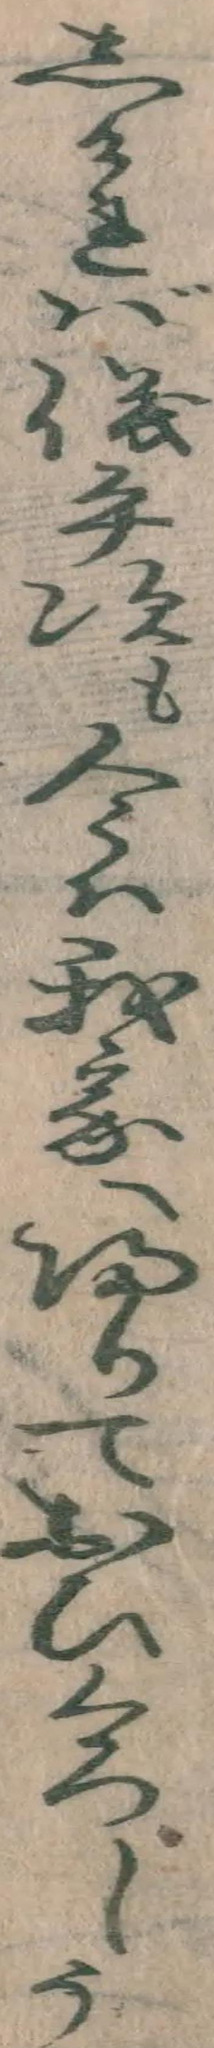しければ儀兵次も今は我家へ帰りておひくろしう
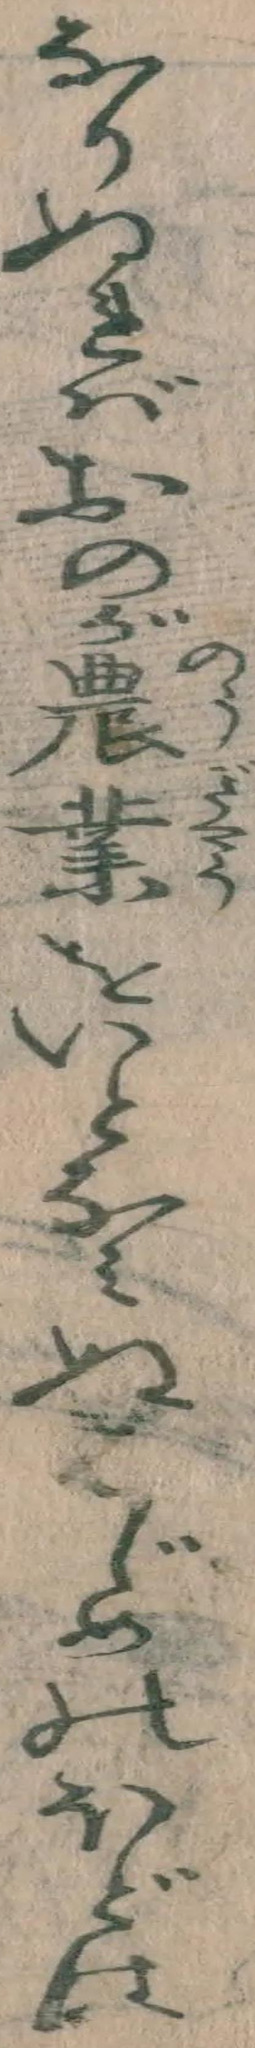なりぬればおのが農業をいとなみぬはじめのほどは
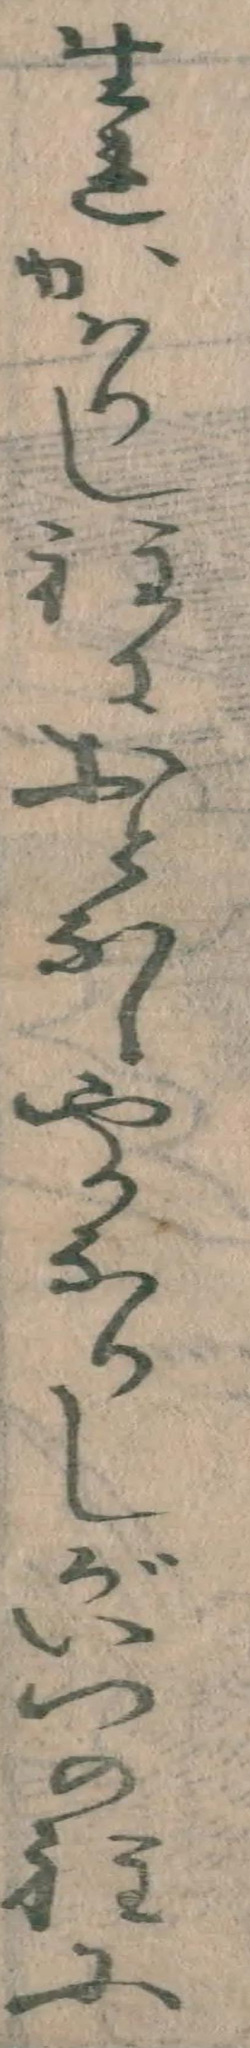生れかはりし程におとなしやかなりしがいつの程に
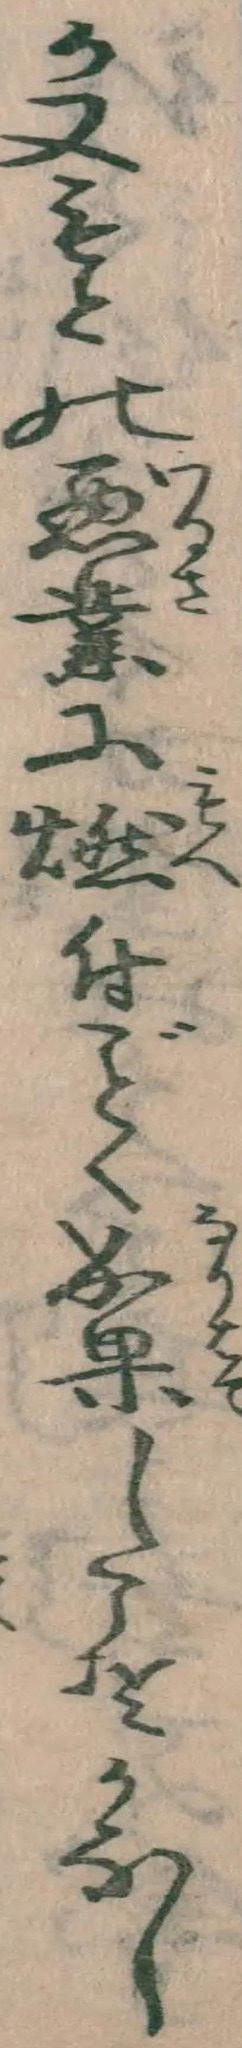か又もとの悪業に燃付ごとく成果しこそかなし
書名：怪談御伽童 5巻. [1]
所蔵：国立国会図書館 National Diet Library, JAPAN
